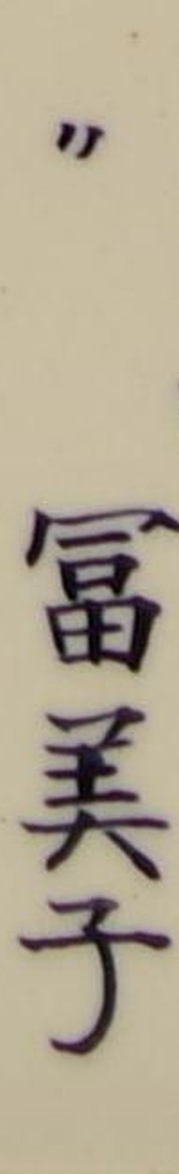冨美子
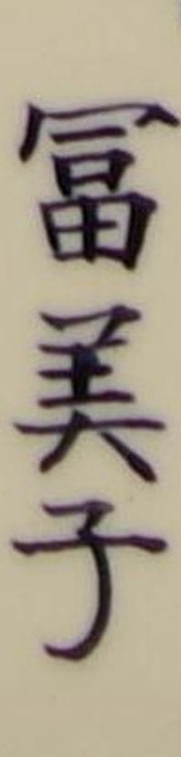冨美子
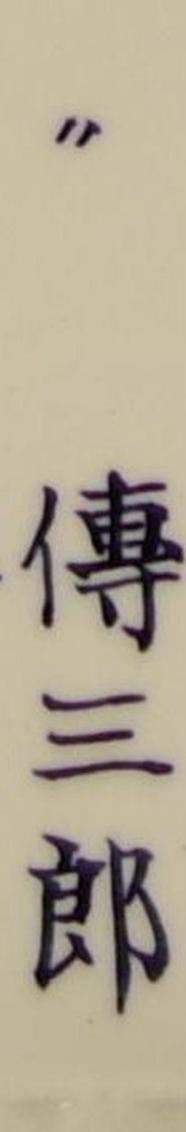傳三郎
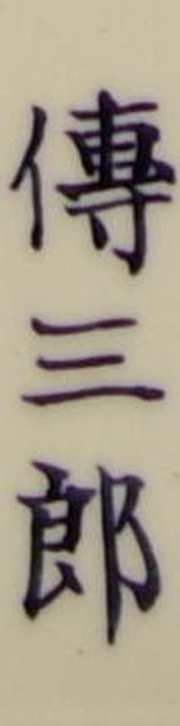傳三郎
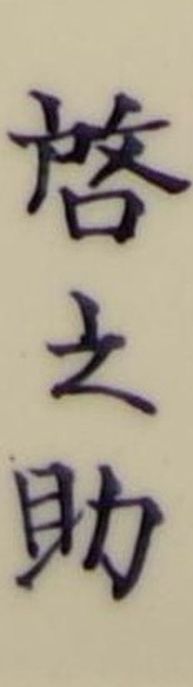啓之助
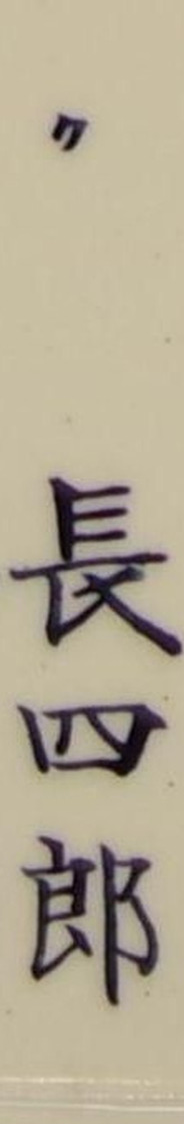長四郎
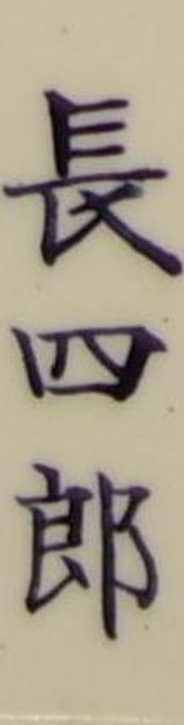長四郎
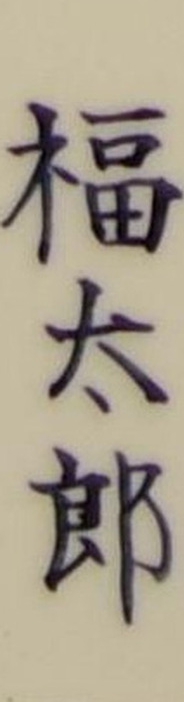福太郎
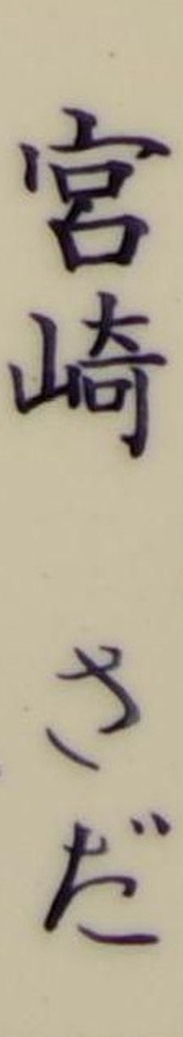宮崎さだ
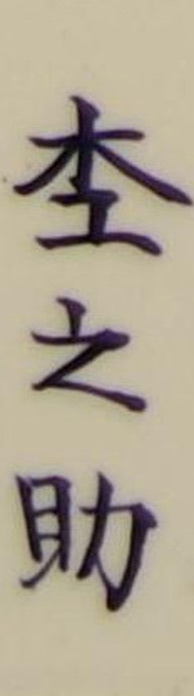杢之助
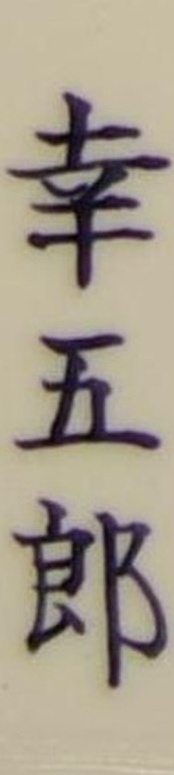幸五郎
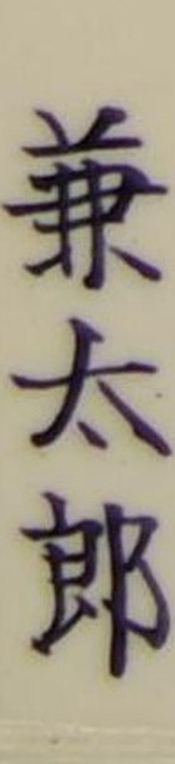兼太郎

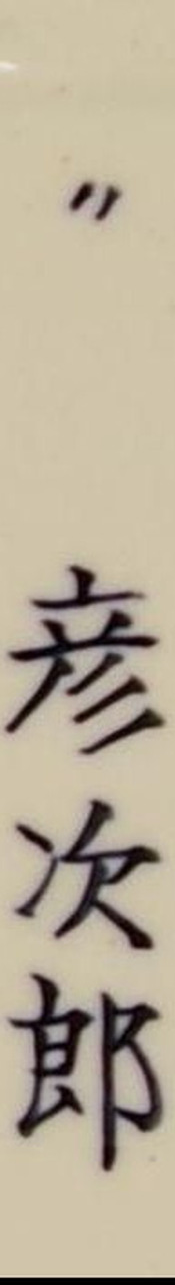彦次郎
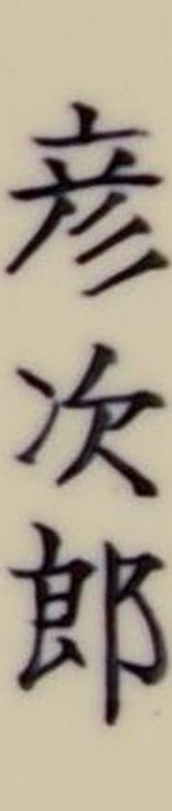彦次郎
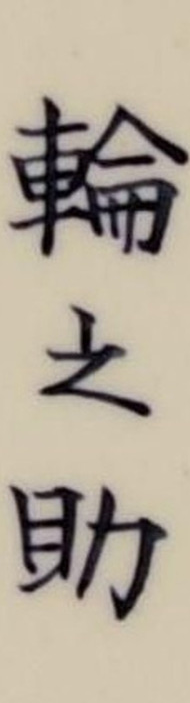輪之助
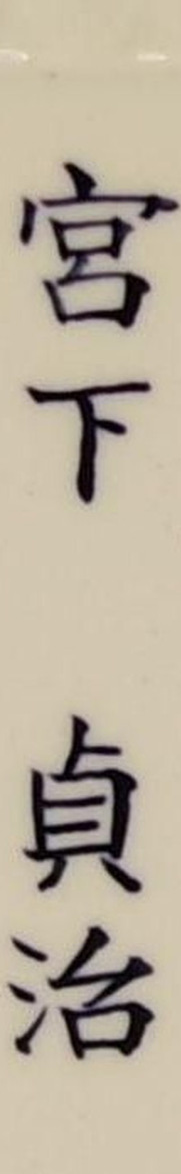宮下貞治
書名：E~L
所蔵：高野山金剛峯寺
